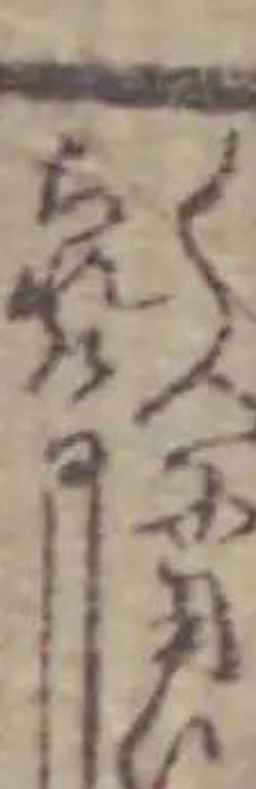られける
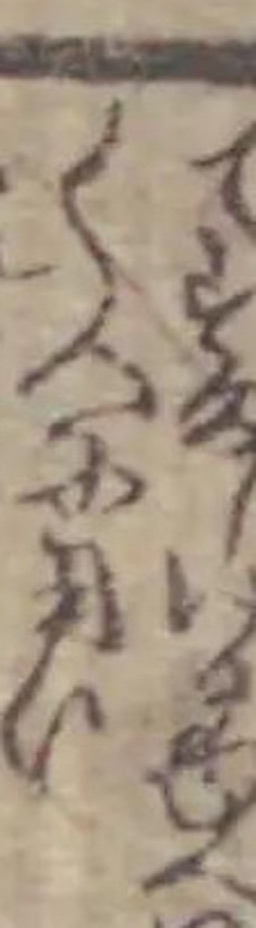〳〵人に用ひ
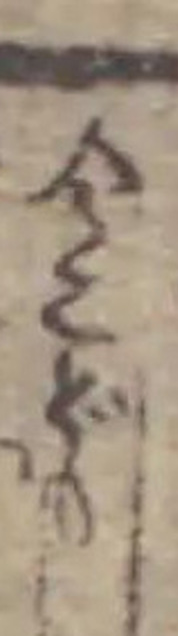今こども
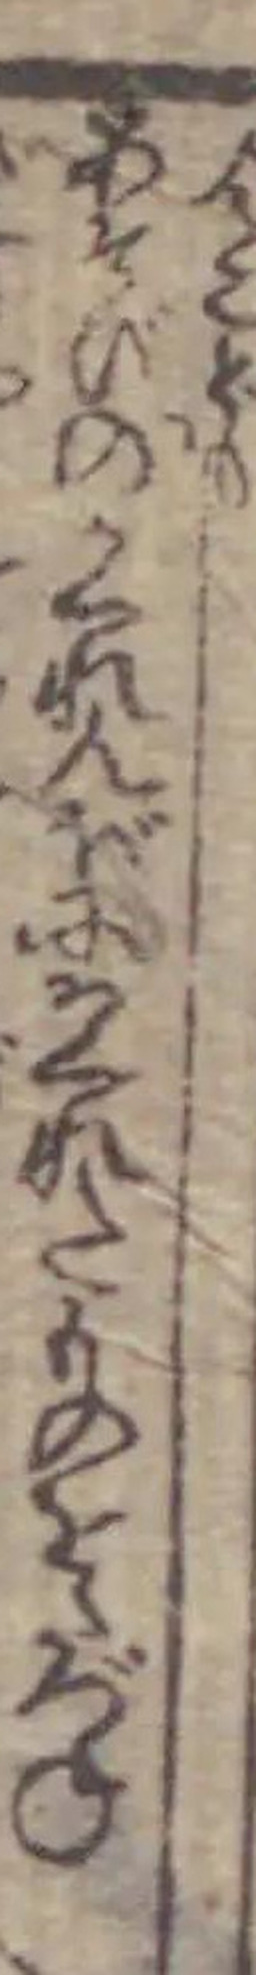あそびのかくれんぼにかくれたものをたづね
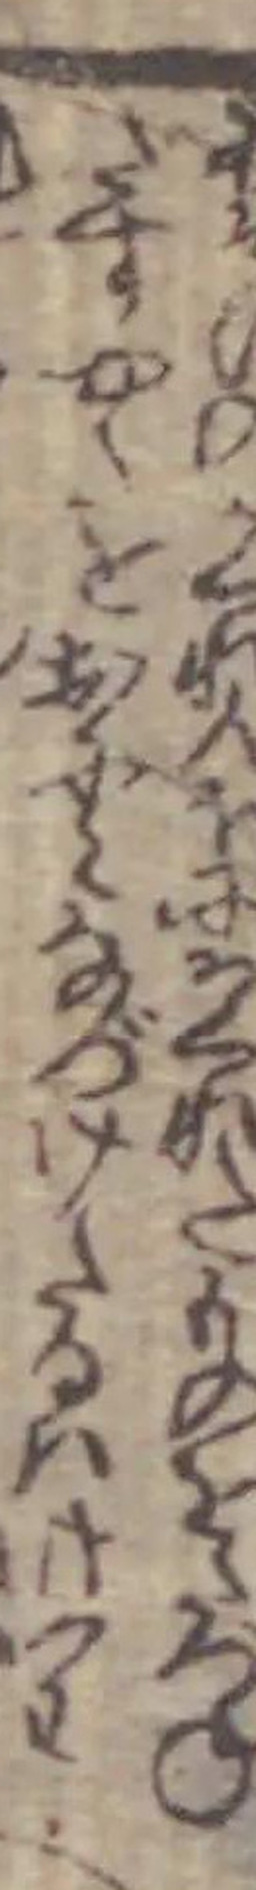たすやくをおにとなづけたるは此いわ
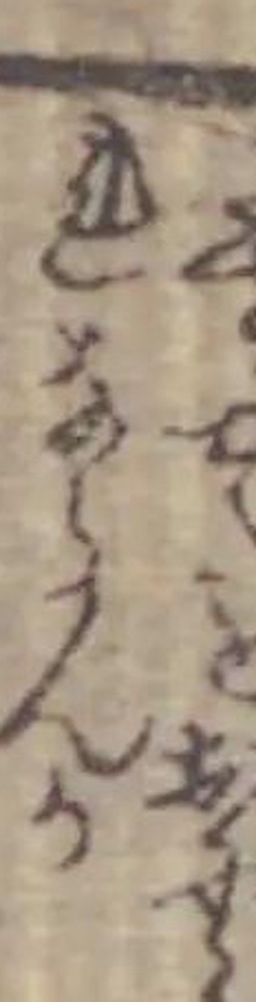れならんか
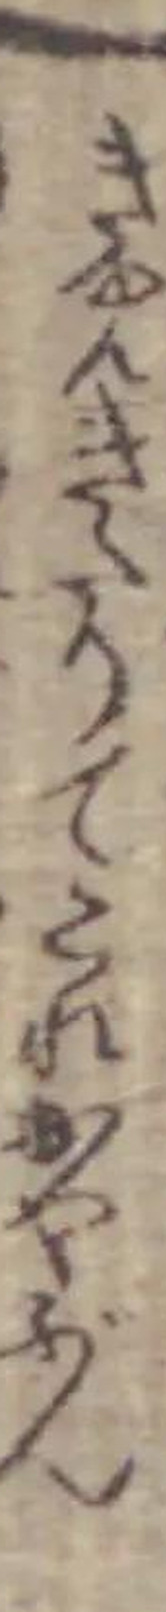きやんきたりてこれおやぶん
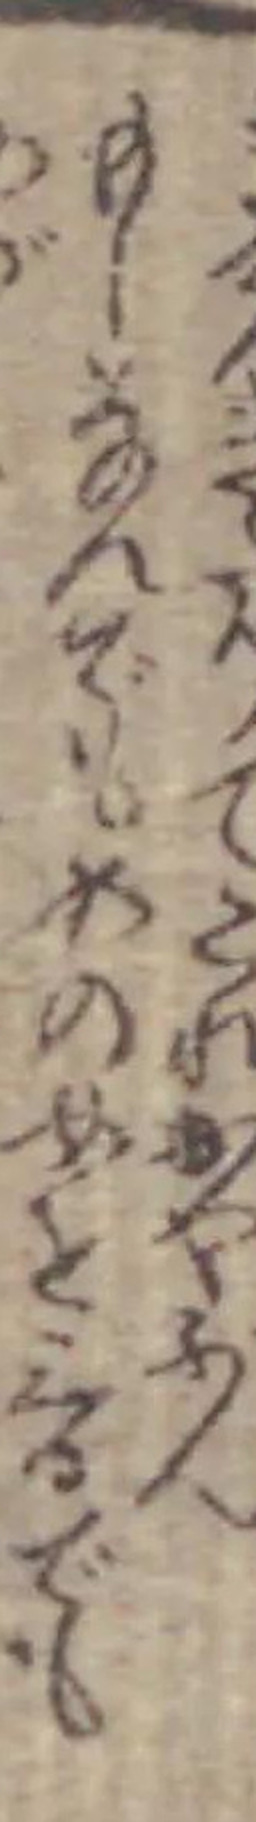もしなんでもあの女を三日でも
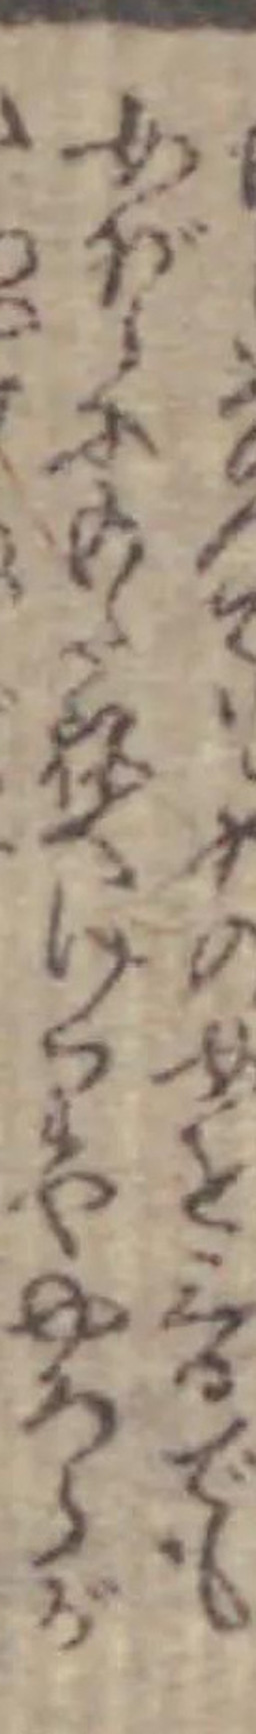女ぼうにもたねへけりややろうが
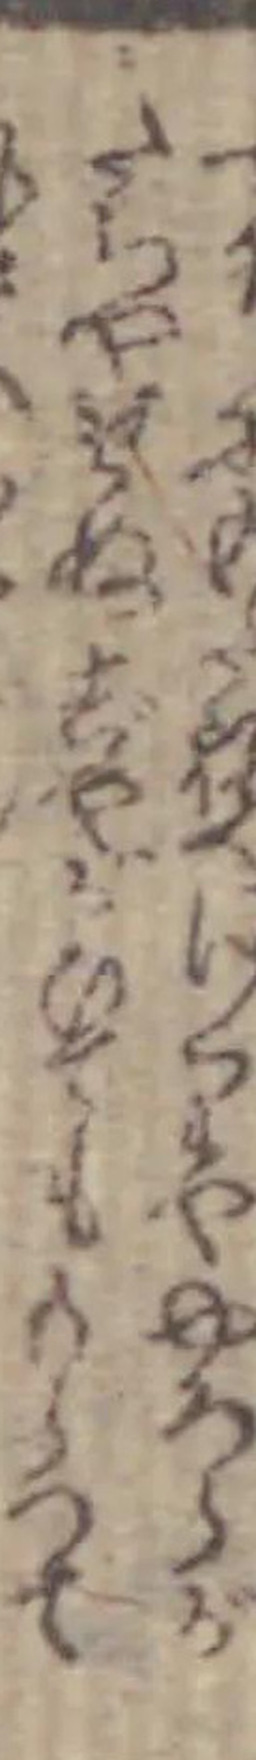たちやせぬじやがひてももらつて
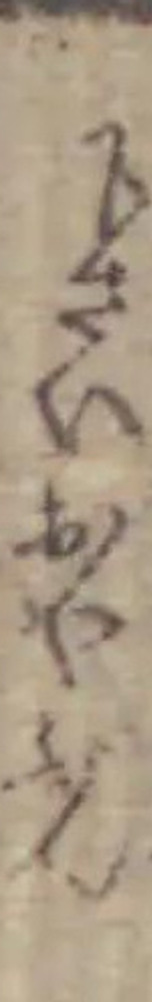下さいおやぶん
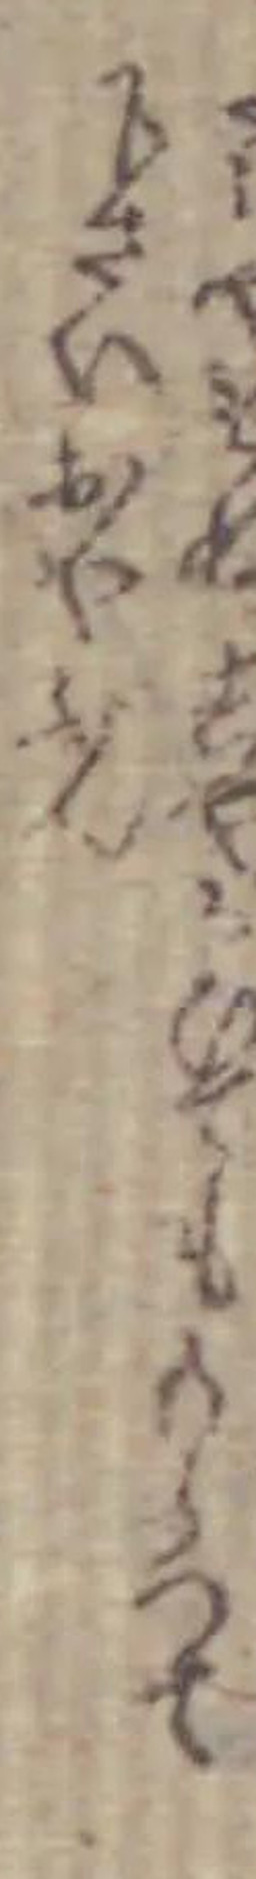下さいおやぶん
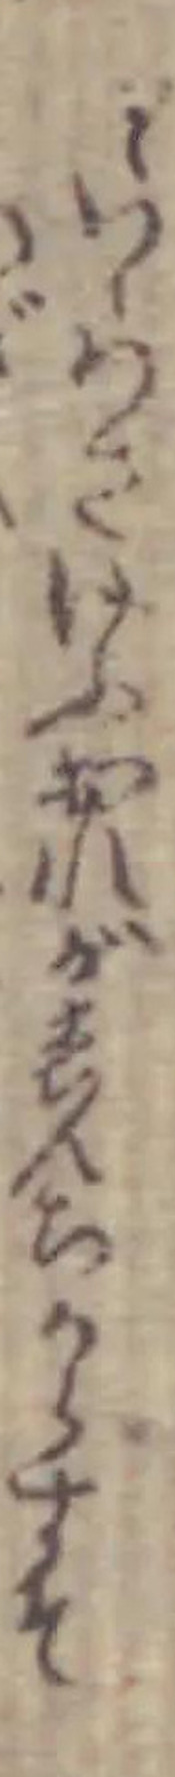アゝいゝさけふおれがしんちからすそ
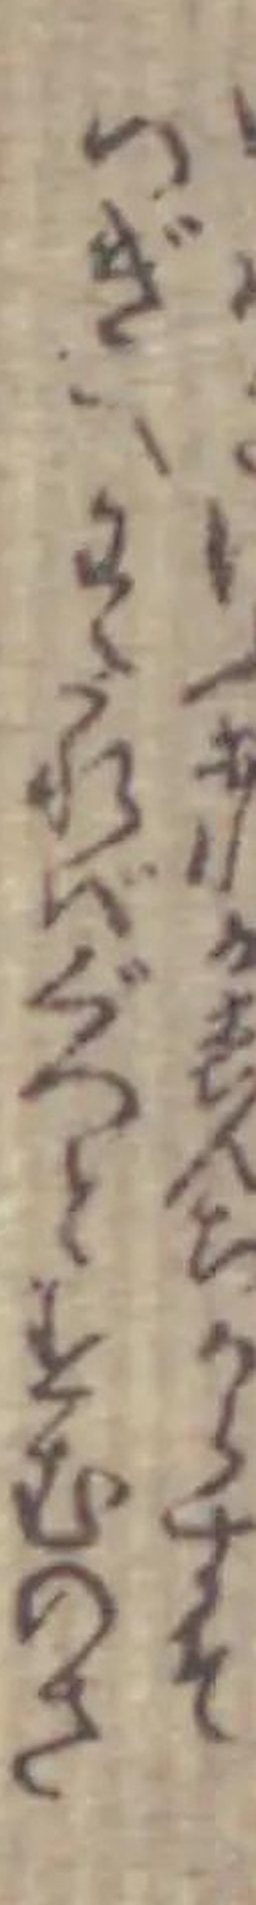つぎへわたればぐつとすむのさ
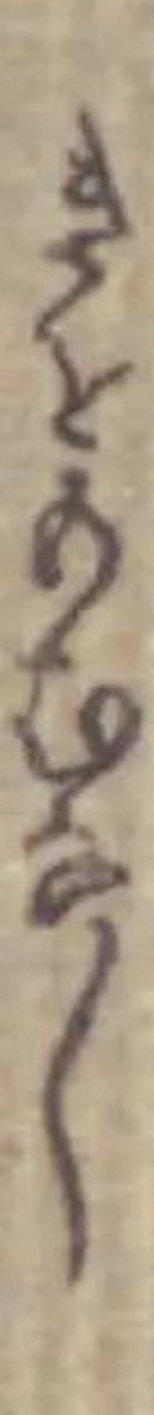きをもむな〳〵
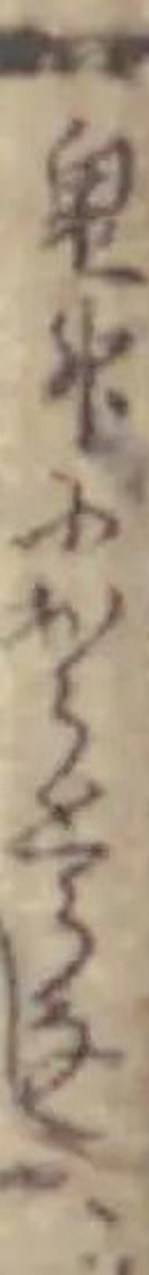鬼神におうとうなし
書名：鬼子宝 3巻
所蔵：国立国会図書館 National Diet Library, JAPAN
